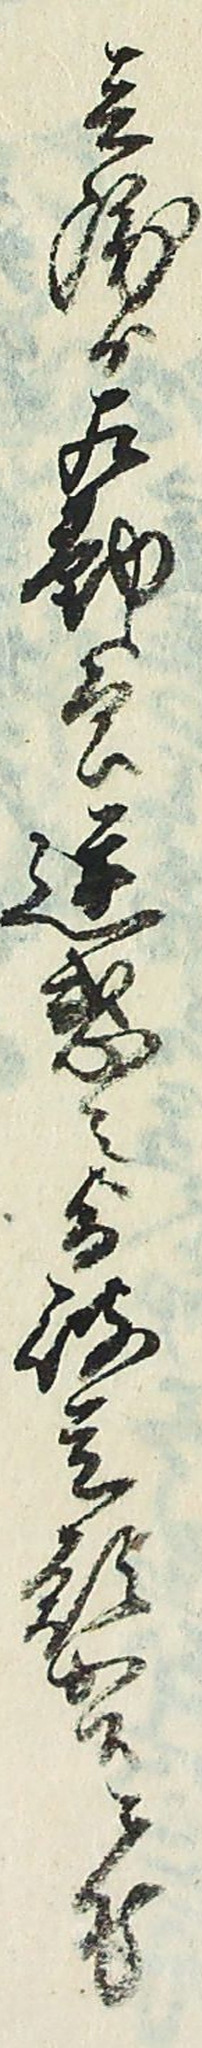一浦より相勤候ては迷惑の旨彼是願出候に付
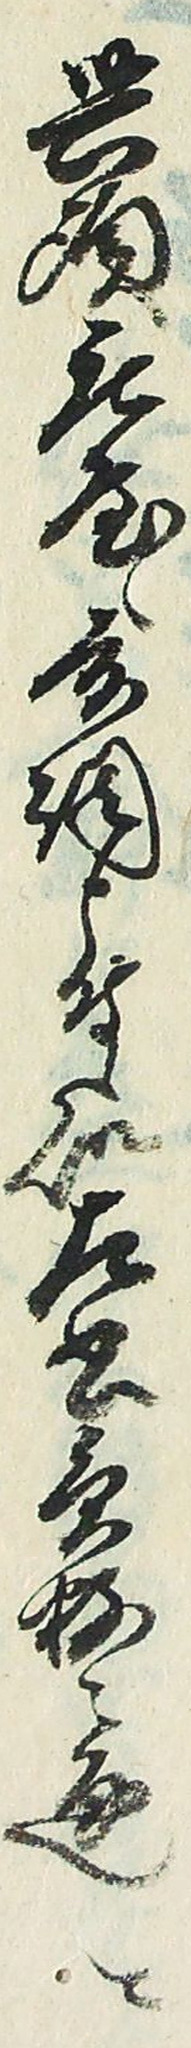与頭庄屋へ取調申付候処左書員数の通
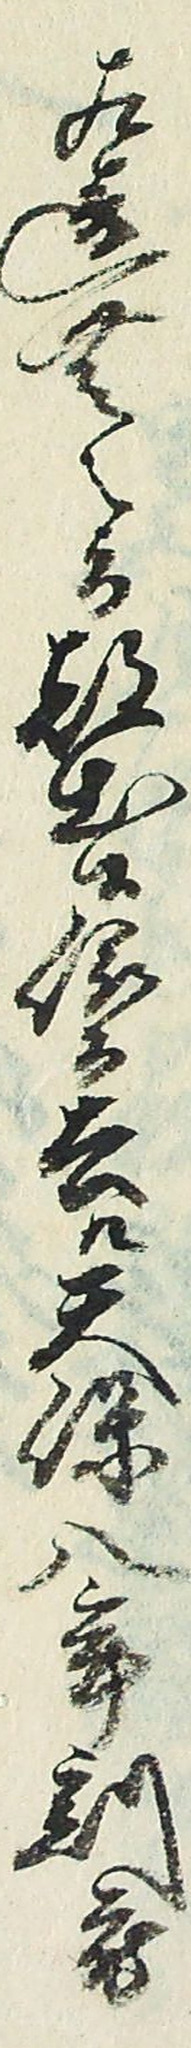相違無之旨都出候依て去る天保八年割符
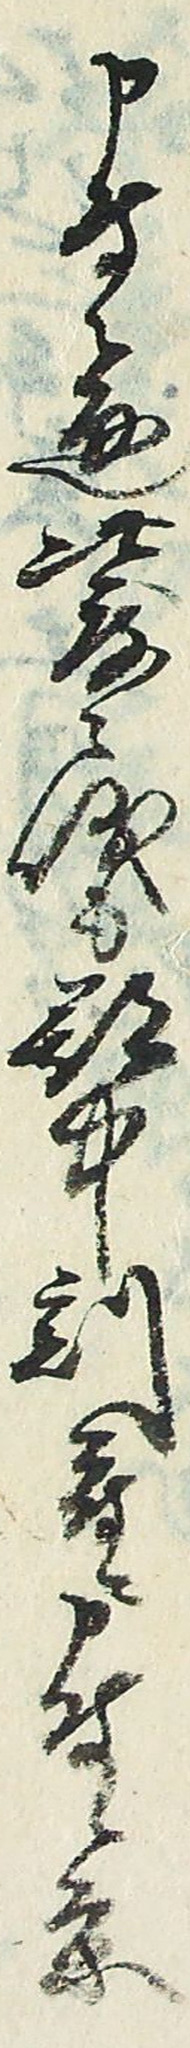申付の通此度の儀も郡中割符に申付候条
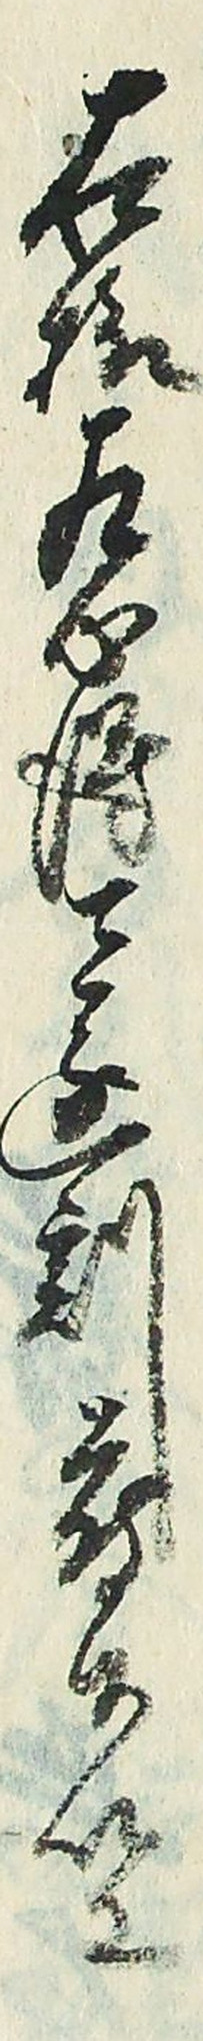右様相心得可遂割符候以上

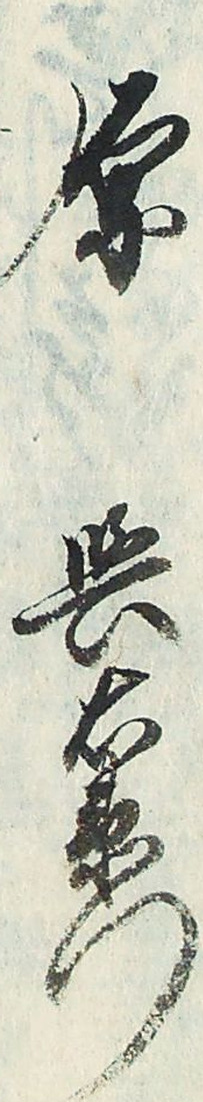原与右衛門
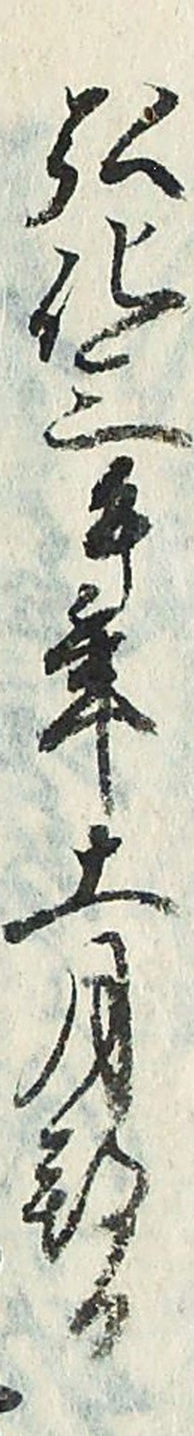弘化三午年十一月朔日
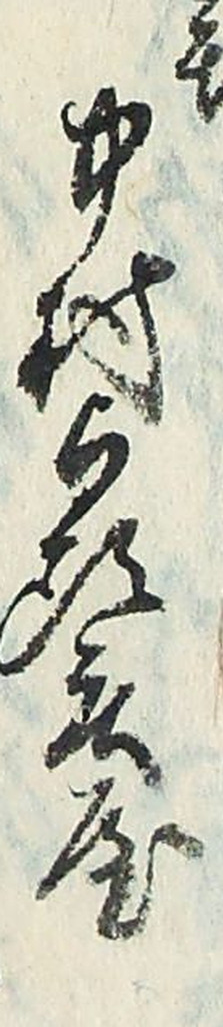中村与頭庄屋
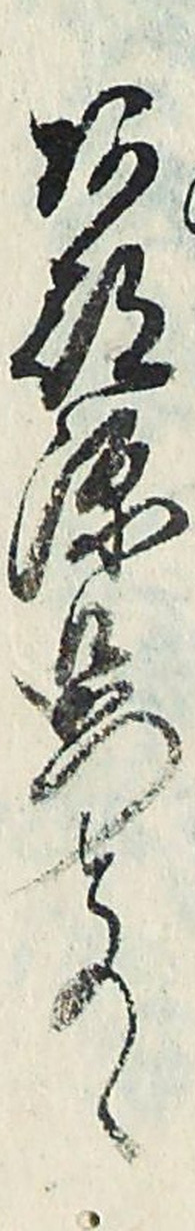阿部源左衛門とのへ
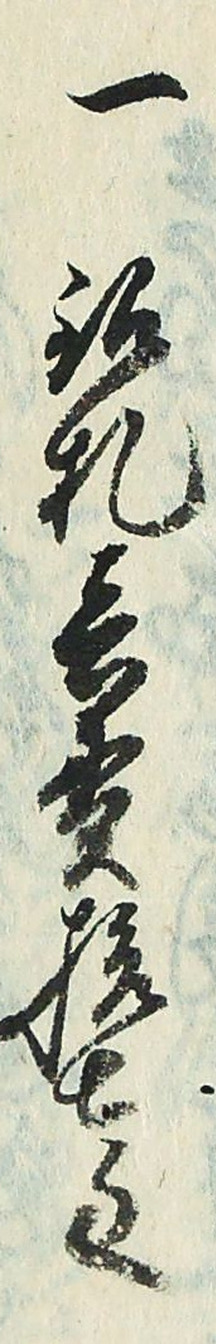一銀札一貫十七匁
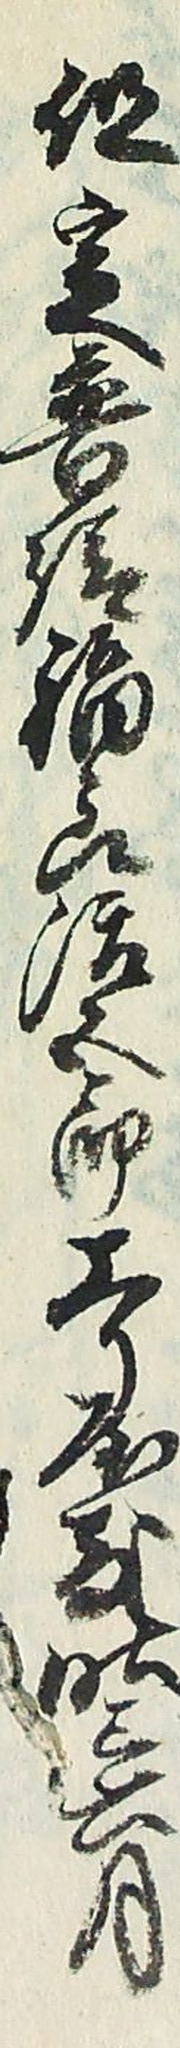但定普請福良活五郎上り屋敷昨巳六月
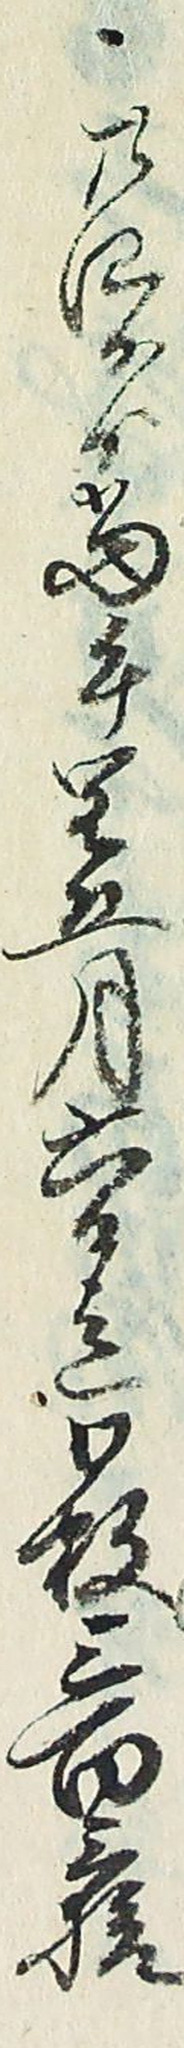二十四日より当午閏五月六日迄日数三百三十
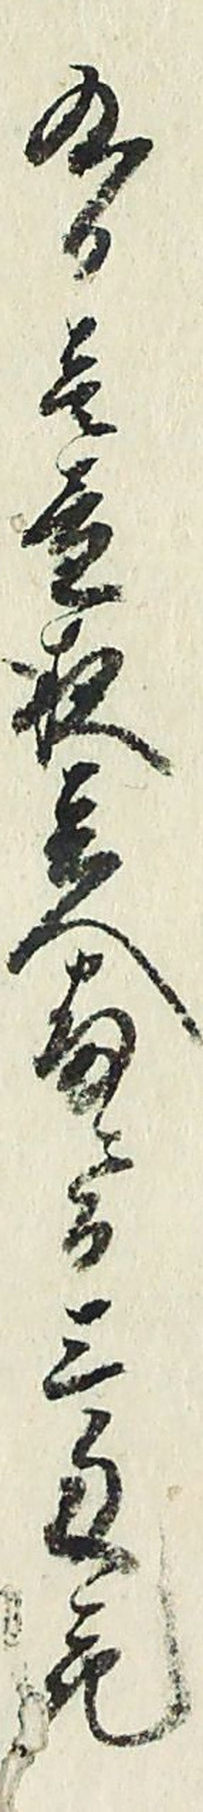九日一昼夜一人番にて三匁宛
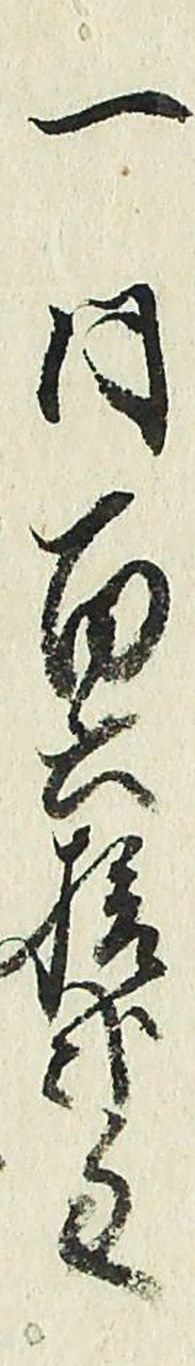一同百六十二匁
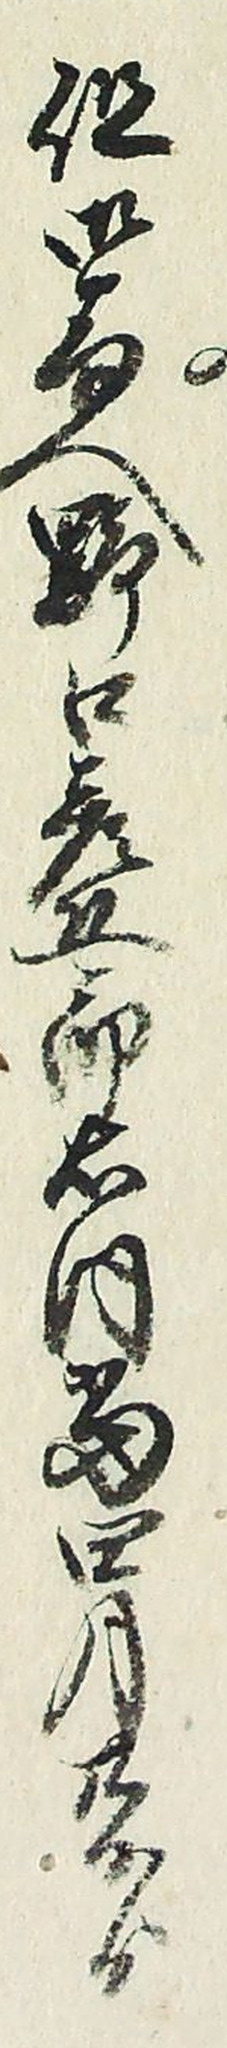但御番人野口彦五郎右内当四月二十日より
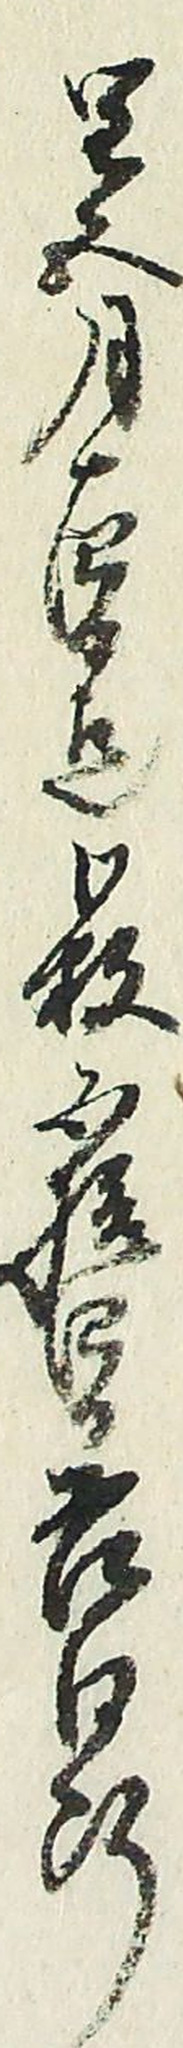閏五月十四日迄日数五十四日右同断
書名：諸割賦物賃銀定記録帳
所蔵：鳴門教育大学 Naruto University of Education
